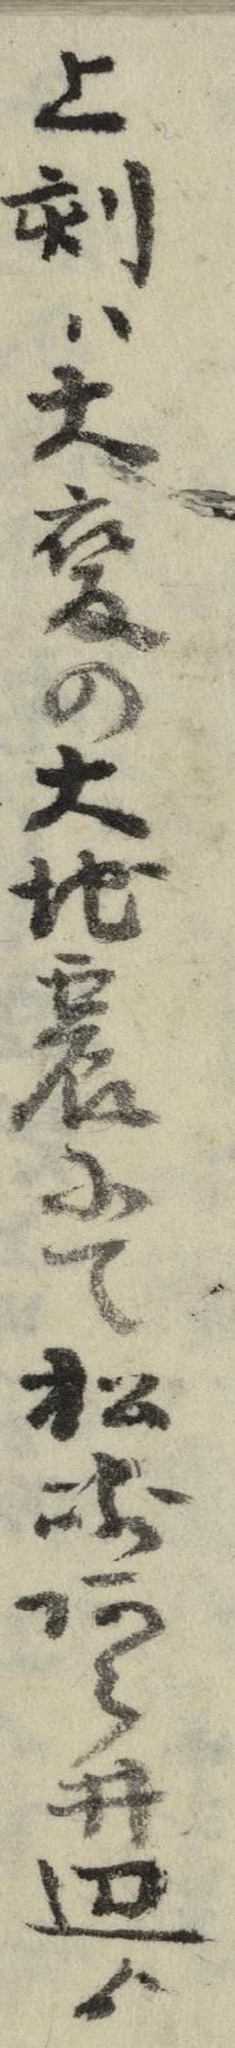上刻ハ大変の大地震にて松崎あら井辺ゟ
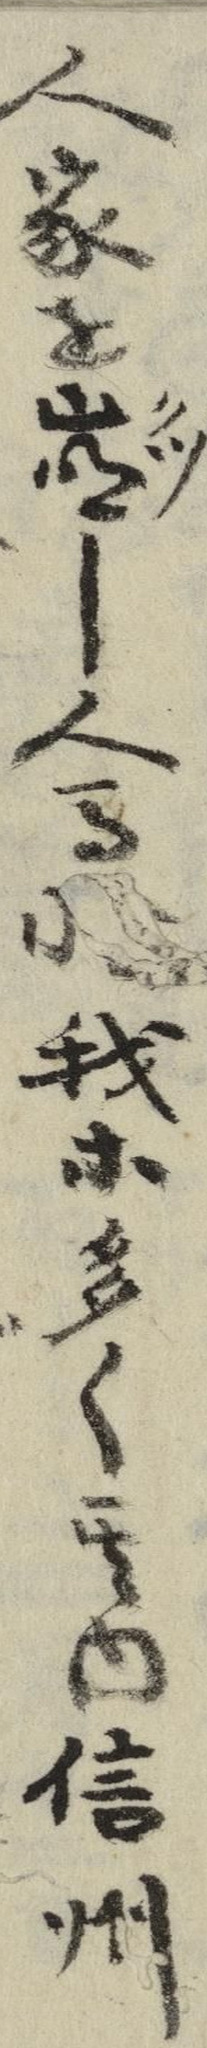人家を崩し人馬怪我等多く其内信州
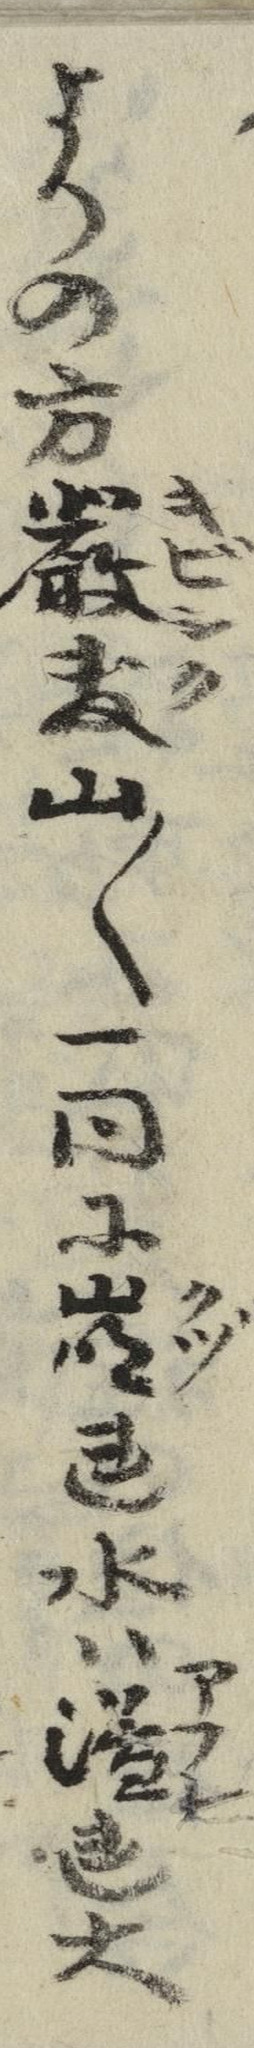よりの方厳敷山々〳〵一同に崩れ水ハ溢れ大
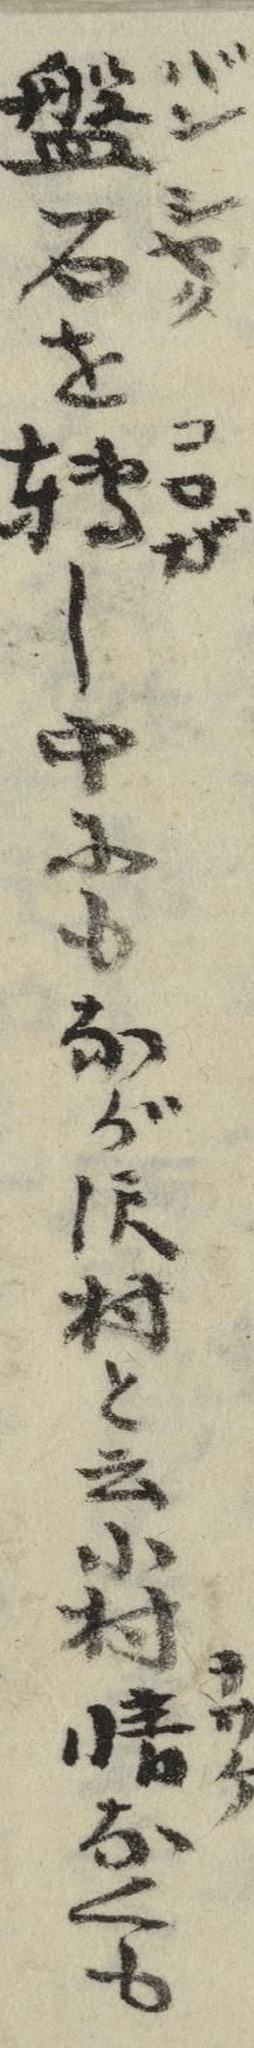盤石を転し中にもなが沢村と云小村情なくも
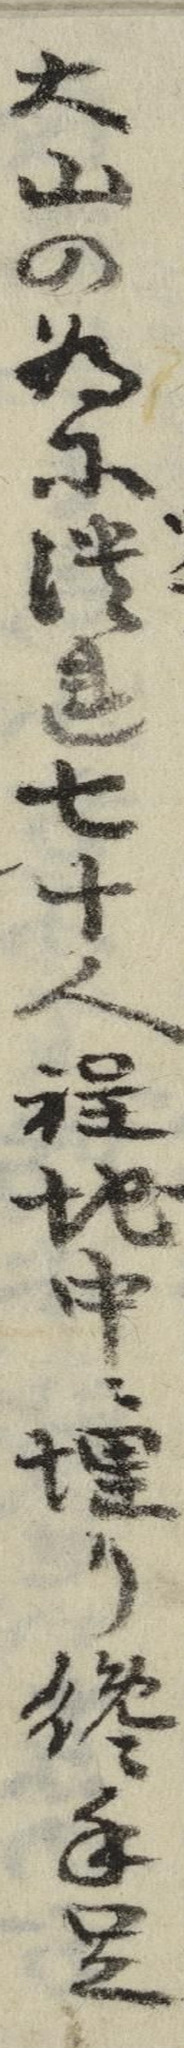大山の為に潰れ七十人程地中二埋り纔手足
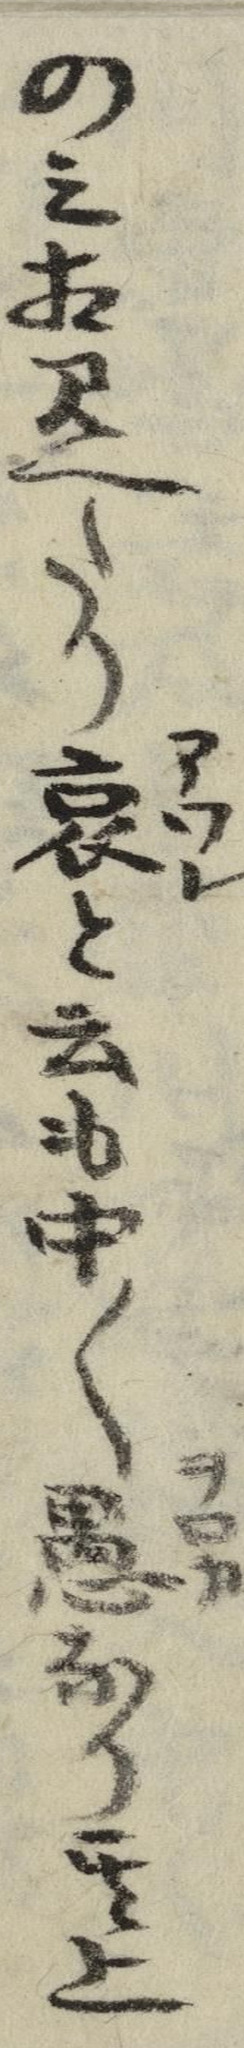のミ相見へたり哀と云も中〳〵愚なり其上
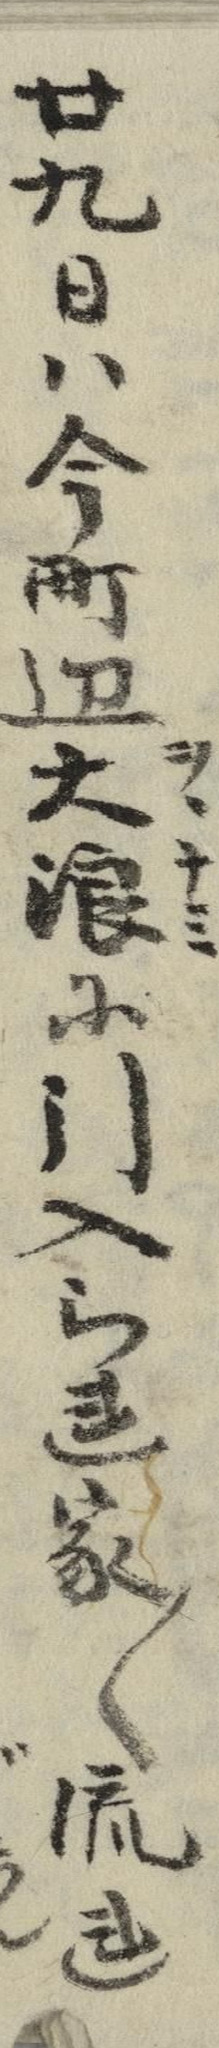廿九日ハ今町辺大浪に引入られ家〳〵流れ
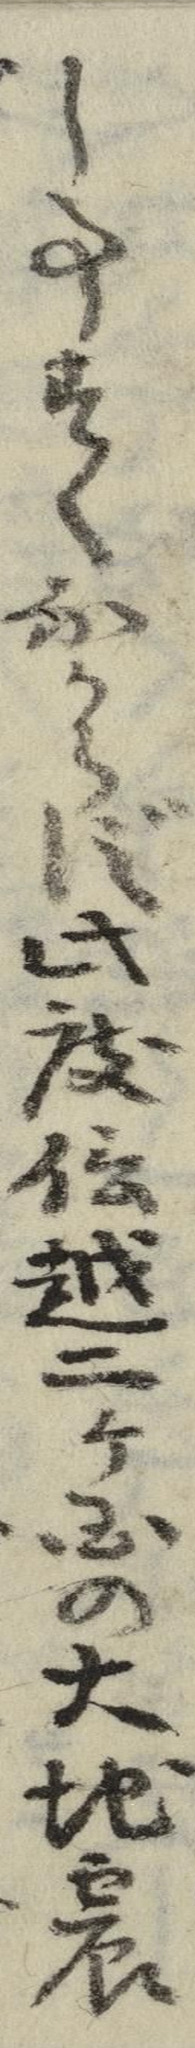し事すくなからず此度信越二ヶ国の大地震
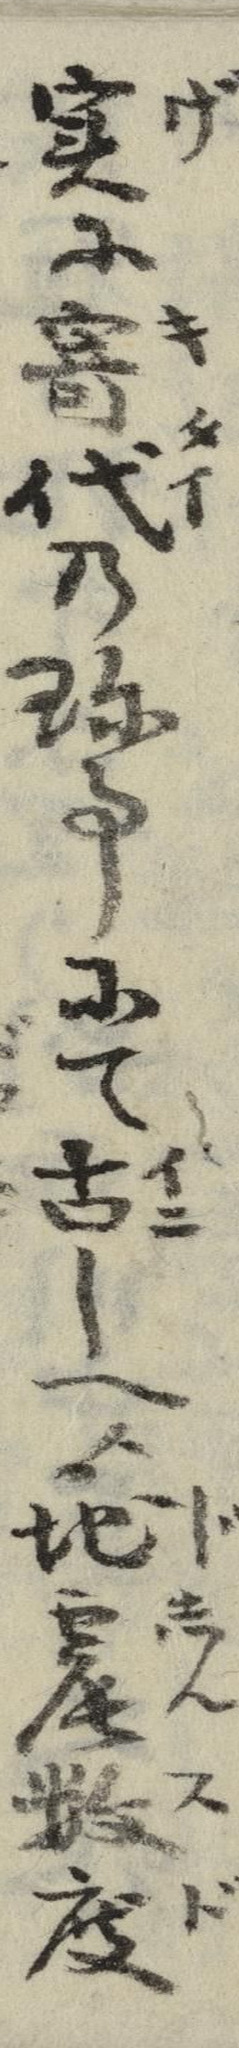実に寄代乃珍事にて古しへゟ地震数度
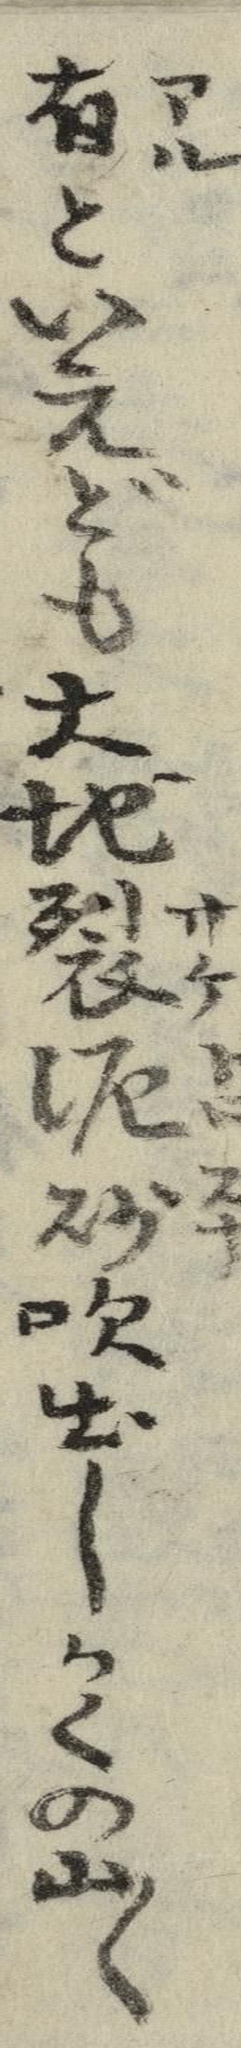有といえども大地裂泥砂吹出しかくの山〳〵
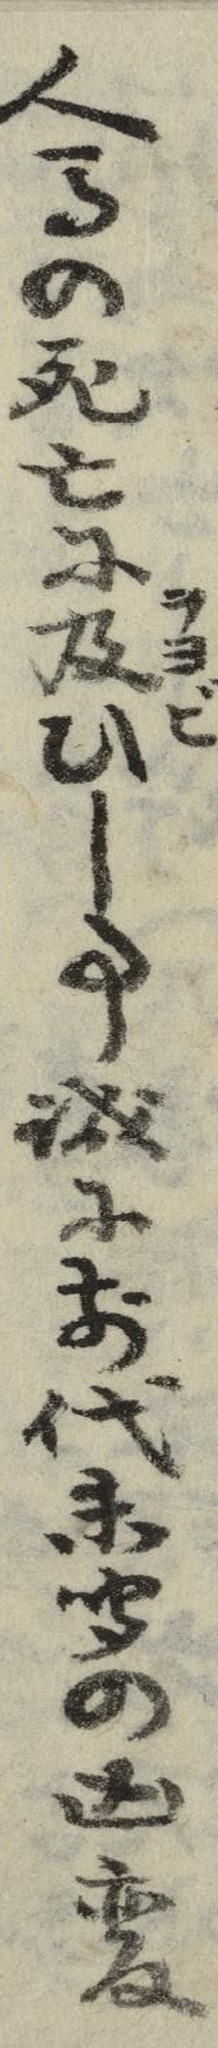人馬の死亡に及ひし事誠に前代未聞の凶変
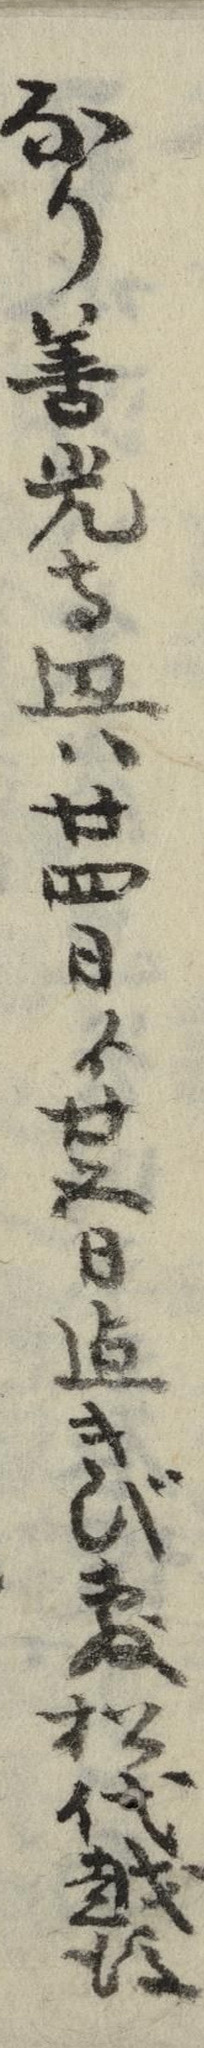なり善光寺辺ハ廿四日ゟ廿五日迄きび敷く松代越後
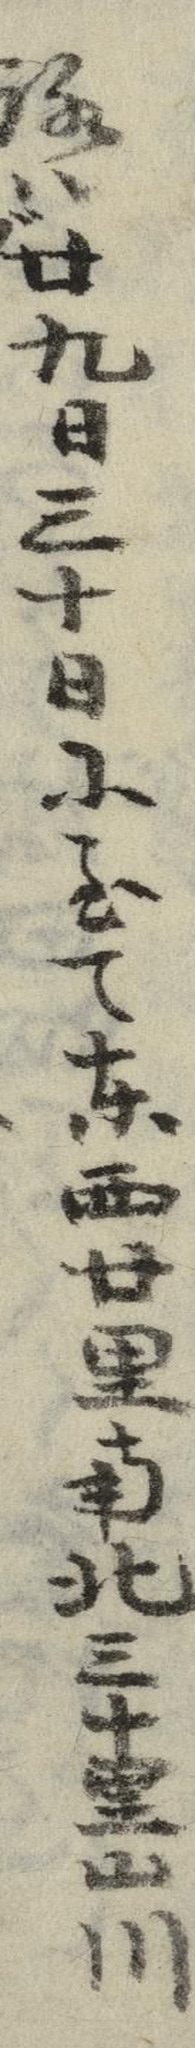路ハ廿九日三十日二至て東西廿里南北三十里山川
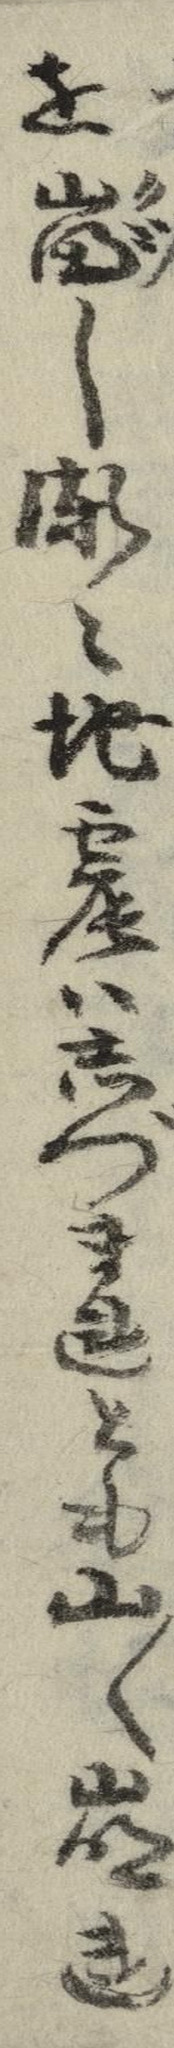を崩し漸々地震ハしづまれとも山〳〵崩れ

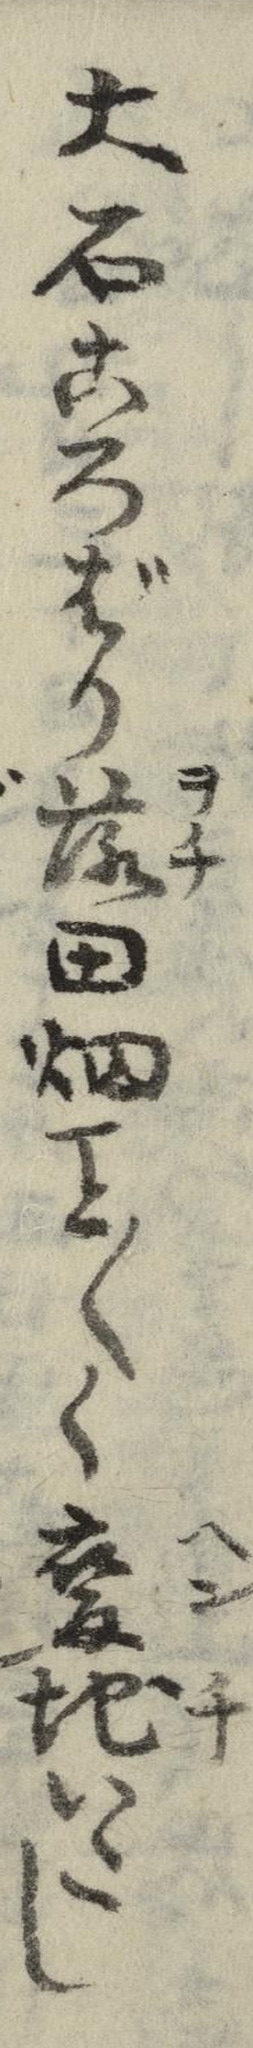大石ころばり落田畑こと〳〵く変地いたし
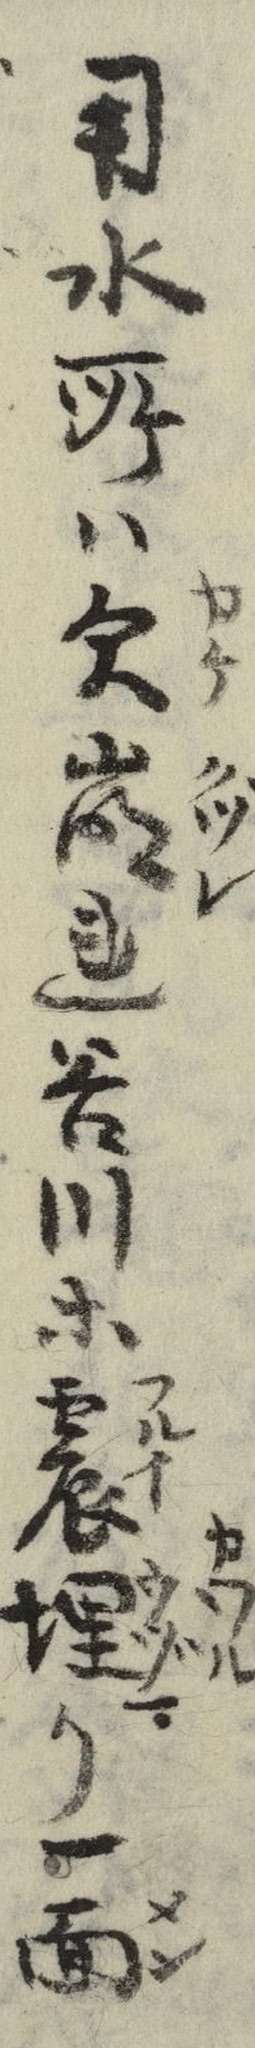用水所ハ欠崩連谷川等震埋り一面
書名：信州大地震一件之冩　丁未弘化四年三月吉日
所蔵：東京大学地震研究所図書室 Earthquake Research Institute Library, The University of Tokyo, JAPAN
